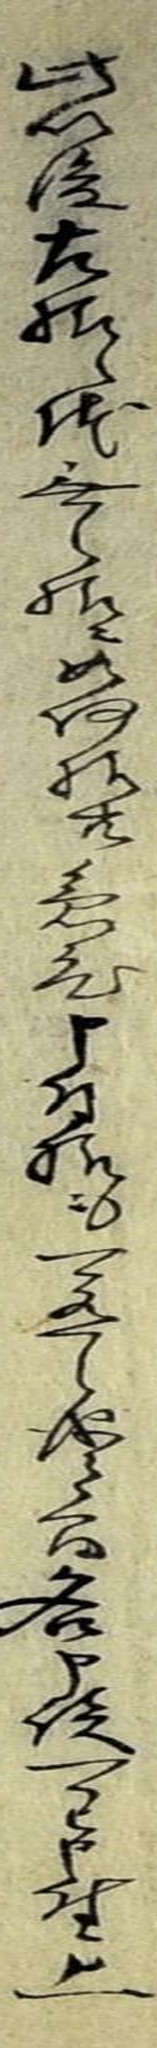此以後左様之体無之様ニ如何様共急度申付様も可有之儀ニ候間各申談可被申付候上
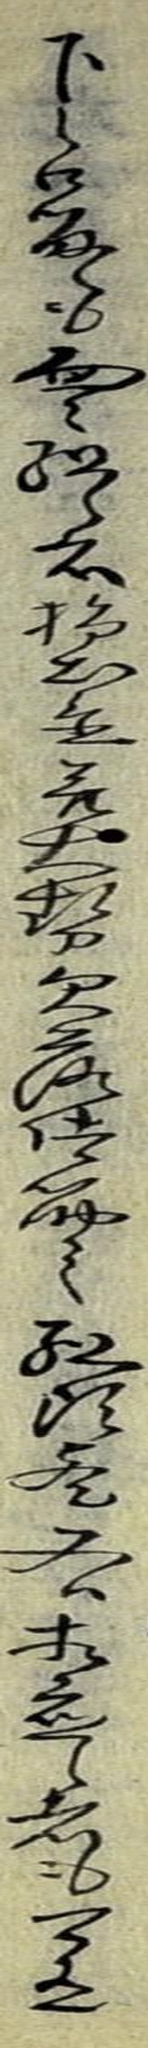下之口留へも面々組之者指出置并大勢欠落仕候筋之組頭歟又ハ相応之者も可有
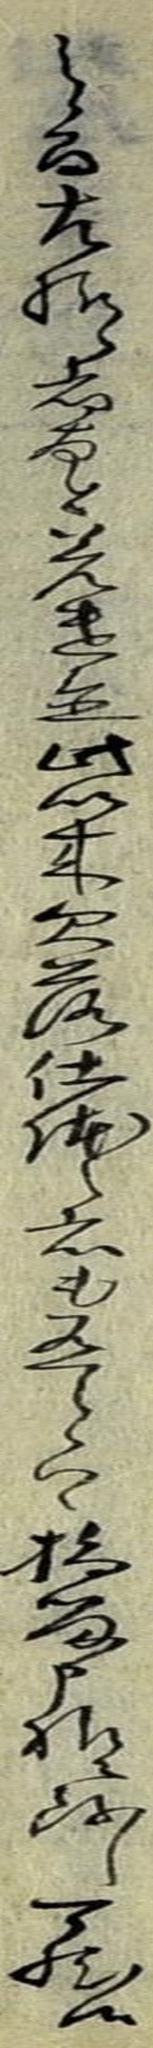之候間左様之者なと差遣置此以来欠落仕体之者も有之候ハヽ指留申様ニ致し可然候
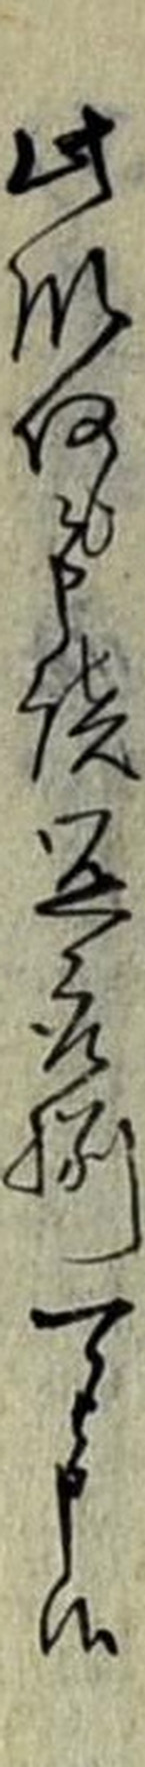此段何も申談宜取捌可被申候
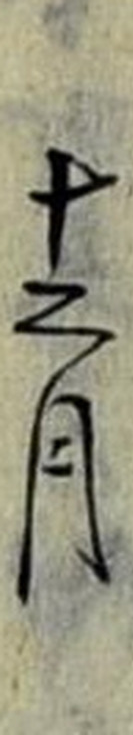十二月
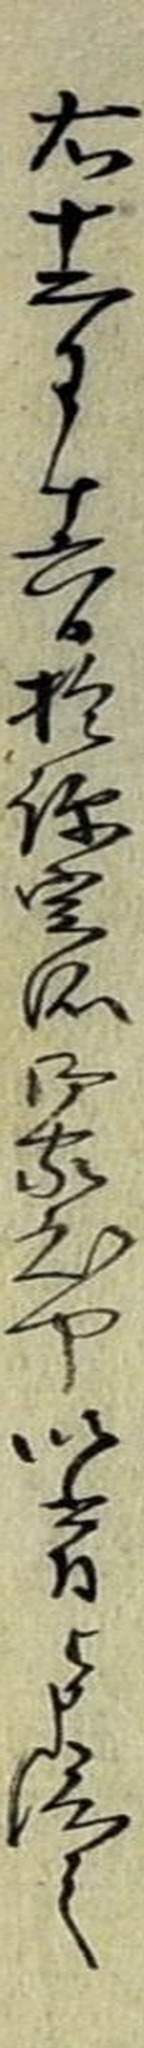右十二月十六日於評定所御家老中以書付被申渡之
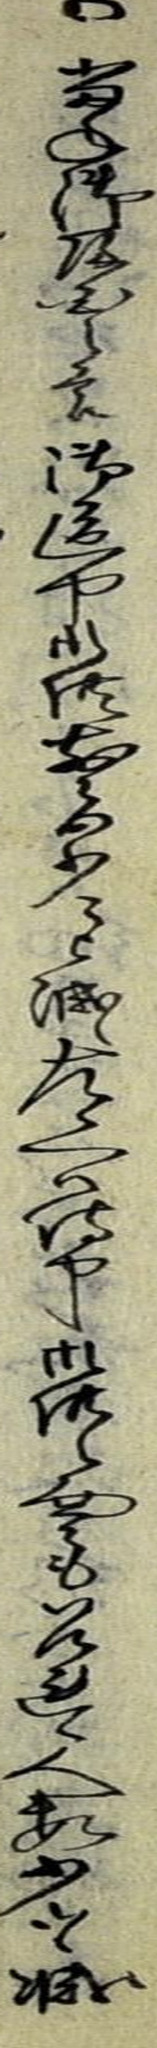〇当年御帰国之節御道中御供前々ゟ少々被減候左候ヘハ侍中御供之面々も召連候人数少ツヽ減
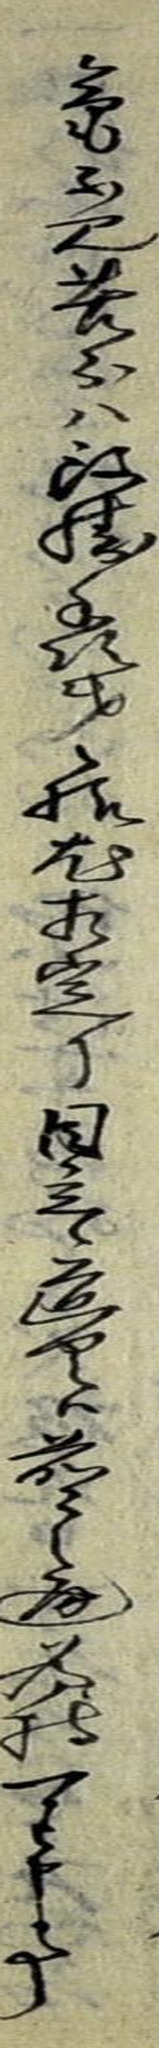候而も不見苦分ハ致勝手次第候様尤相定り目立候道中ハ前々之通為持可被申事
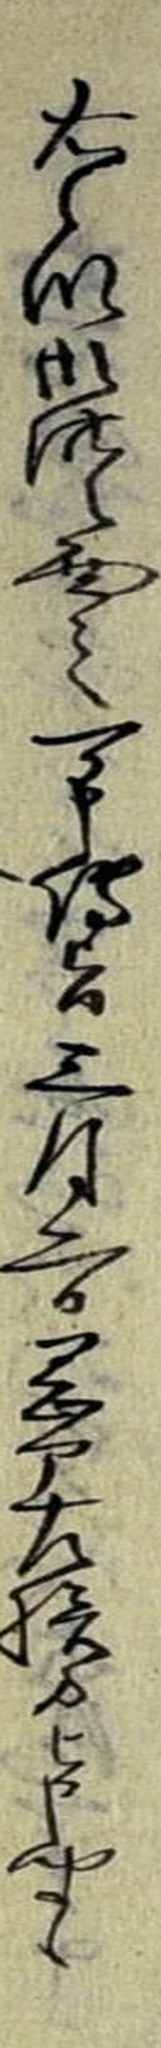右之段御供之面々へ可申伝旨三月二日岡部左膳方被申聞候
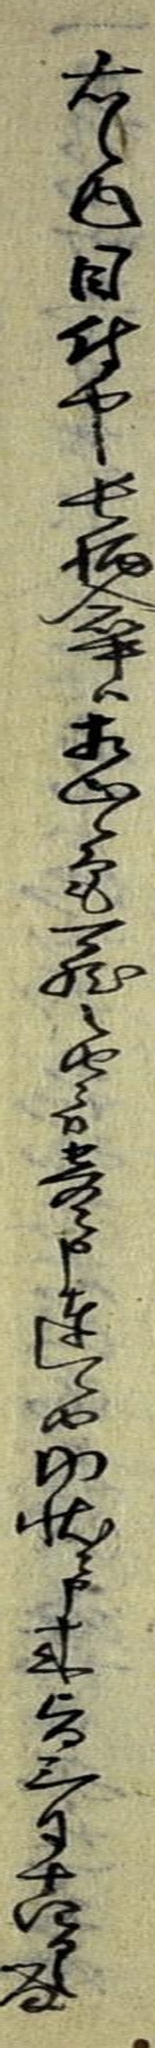右之内目付中長柄傘ハ相止候而も可然之由ニ付寄々申達候由内状ニ申来旨三月十四日之留
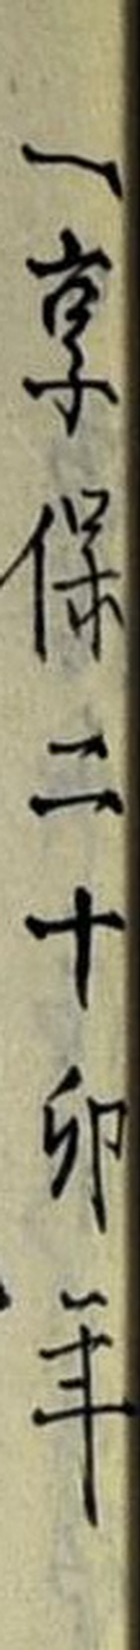一享保二十卯年
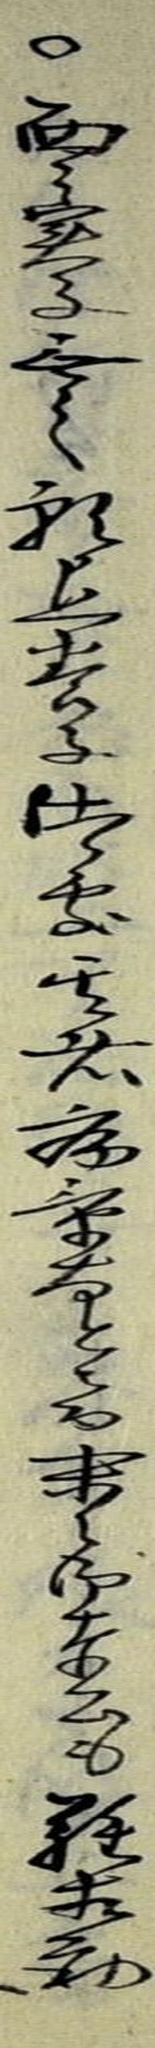〇面々実子無之願申上養子仕候処其者病気なとニ而末々御奉公も難相勤
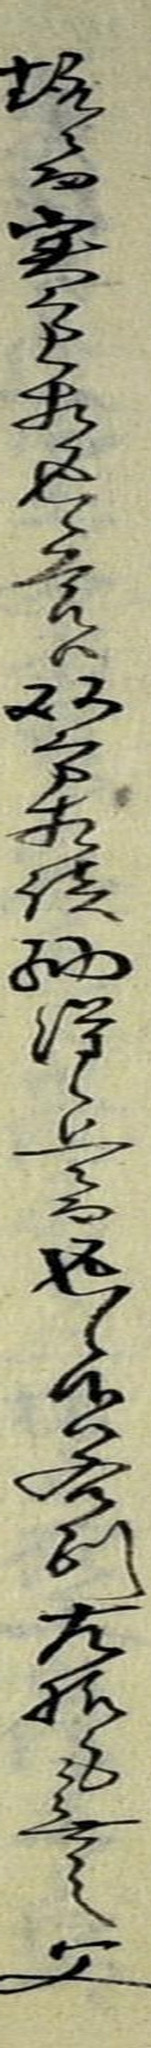趣ニ而実方へ相返候節ハ双方相談納得之上ニ而返し候ハ各別左様ニも無之父
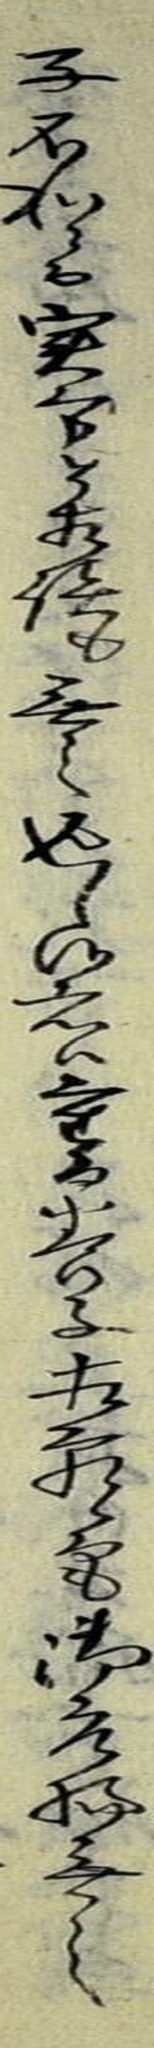子不和ニ而実方と相談も無之返し候者ハ重而養子相願候而も御取揚無之
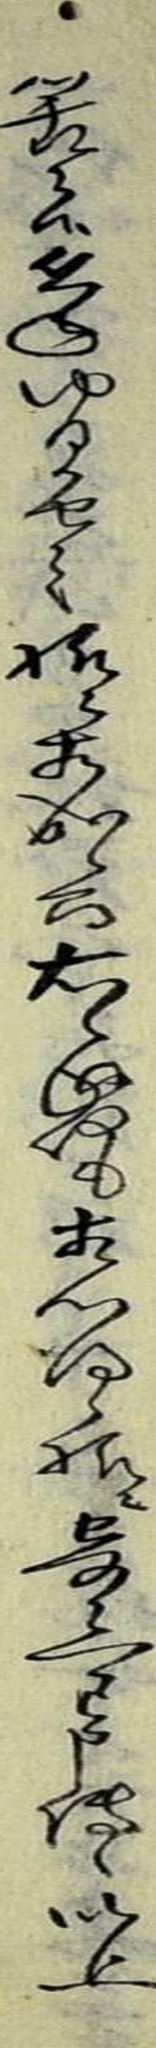筈ニ候近年ゆるかせ之様ニ相成候間右之趣何も相心得候様ニ寄々可被申伝候以上
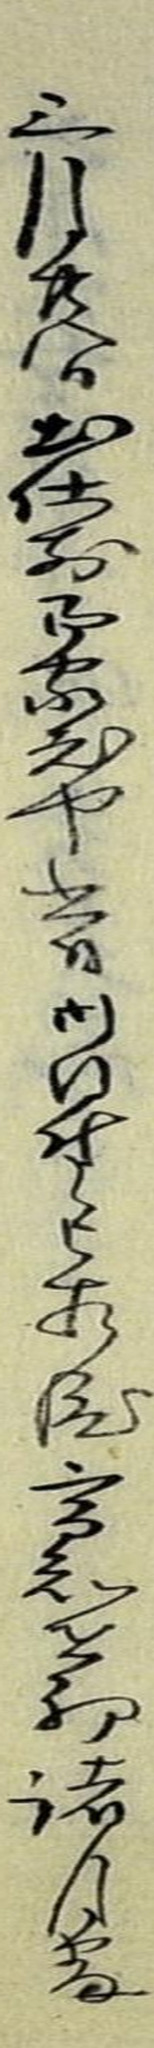三月廿八日出仕前御家老中書付御目付へ被相渡高知を初諸月番
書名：命令之部 一
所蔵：福井県文書館 Fukui Prefectural Archives
